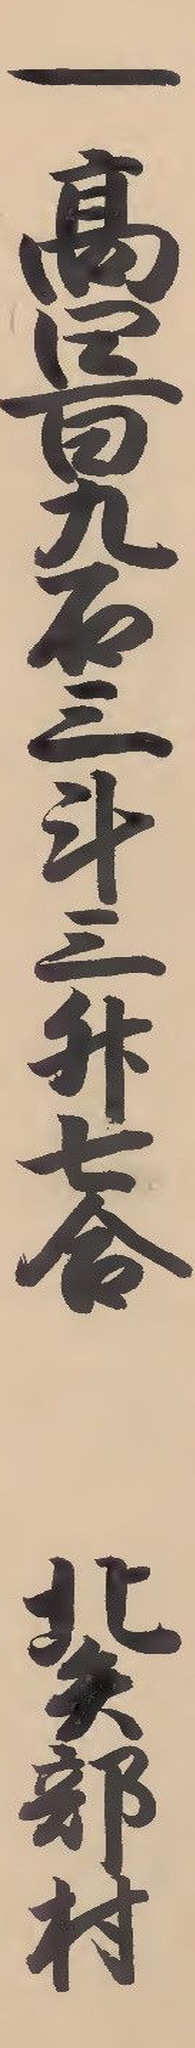一高四百九石三斗三升七合北矢部村
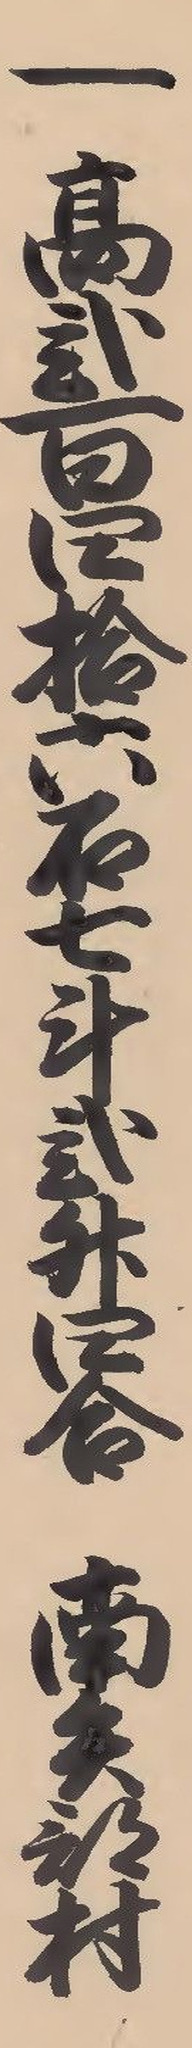一高弐百四拾六石七斗弐升四合南矢部村
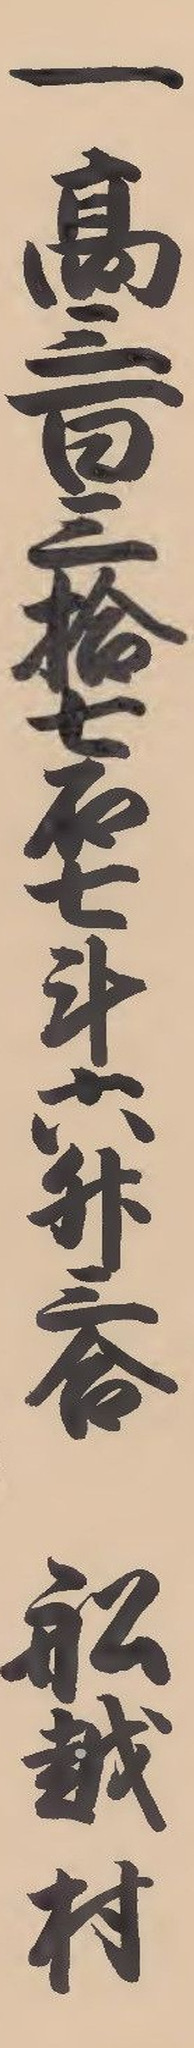一高三百三拾七石七斗六升三合船越村
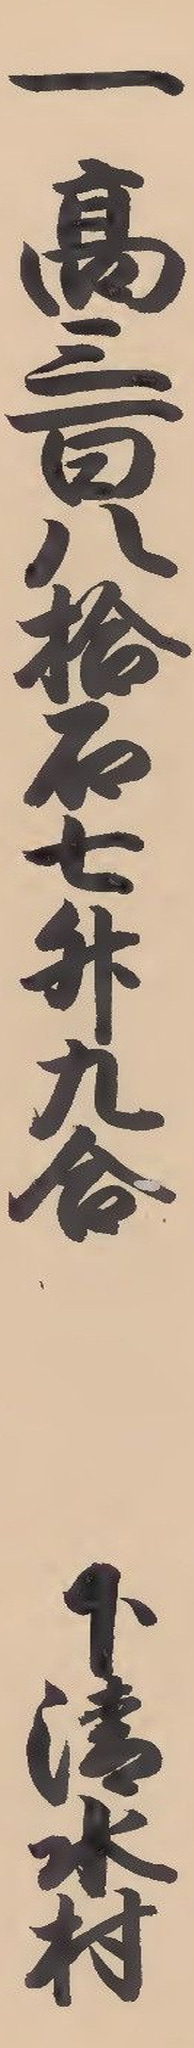一高三百八拾石七升九合下清水村

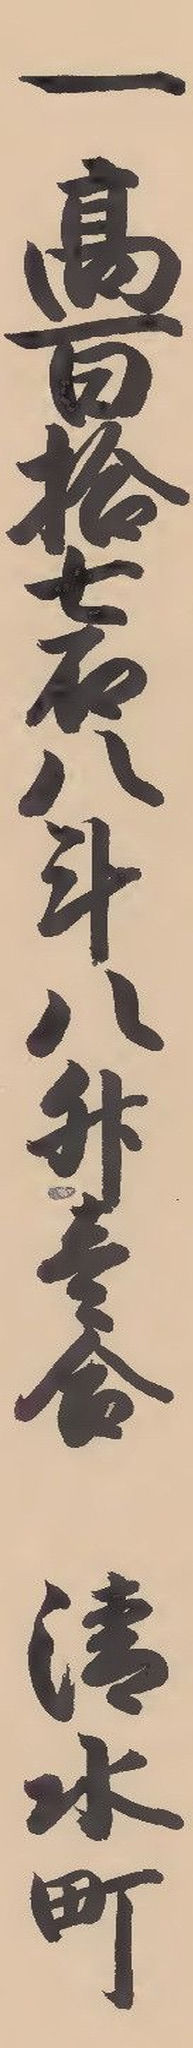一高百拾七石八斗八升壱合清水町
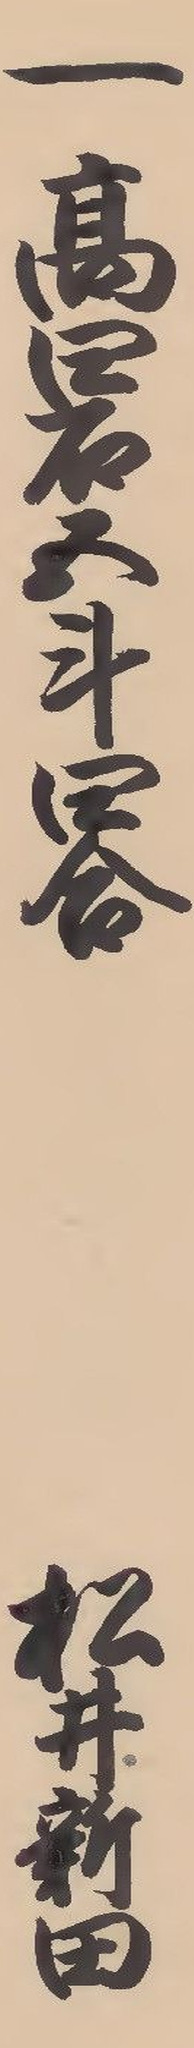一高四石五斗四合松井新田
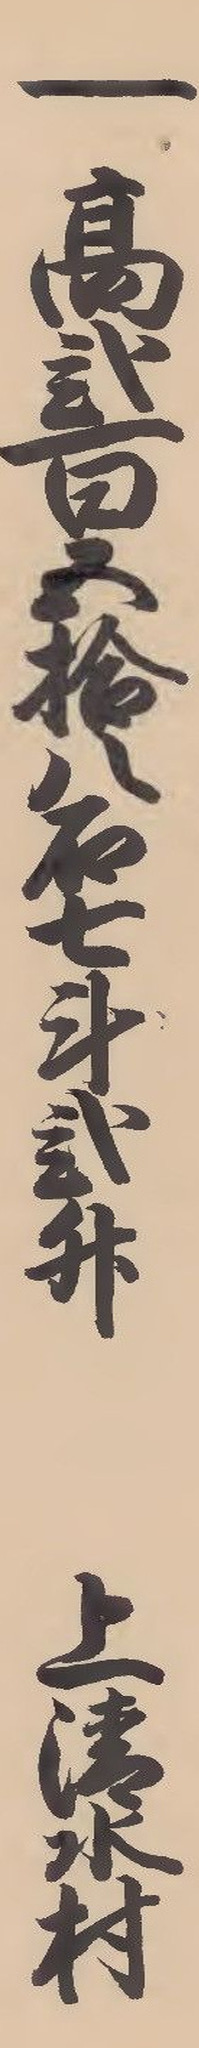一高弐百五拾八石七斗弐升上清水村
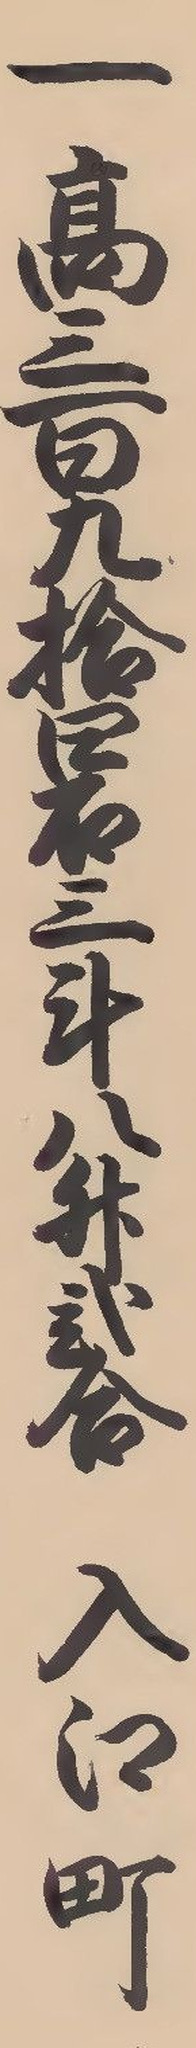一高三百九拾四石三斗八升弐合入江町
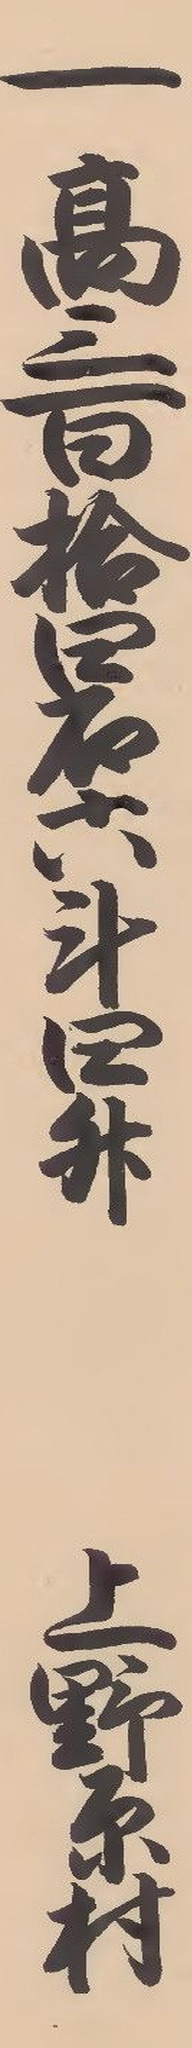一高三百拾四石六斗四升上野原村
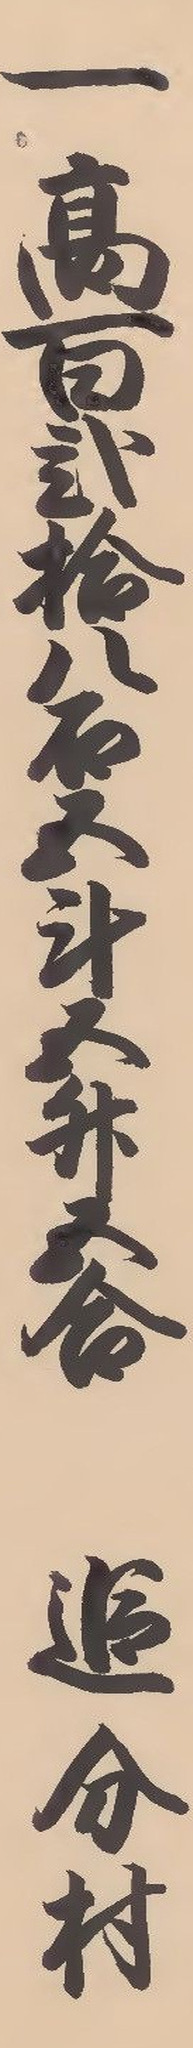一高百弐拾八石五斗五升五合追分村
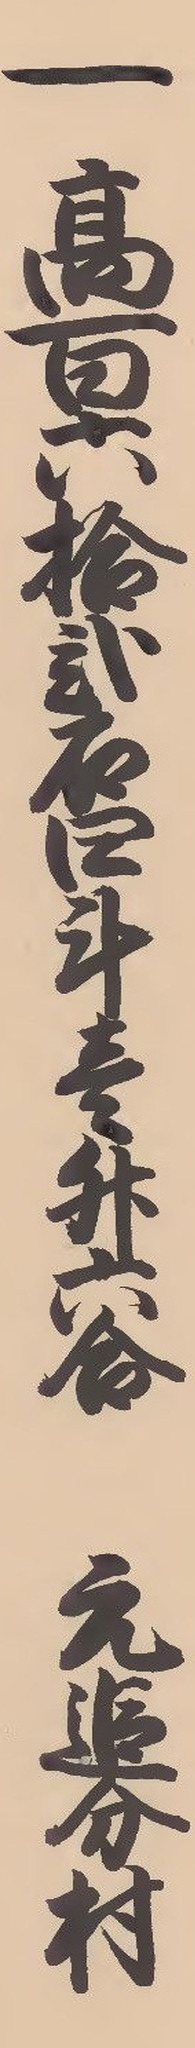一高百六拾弐石四斗壱升六合元追分村
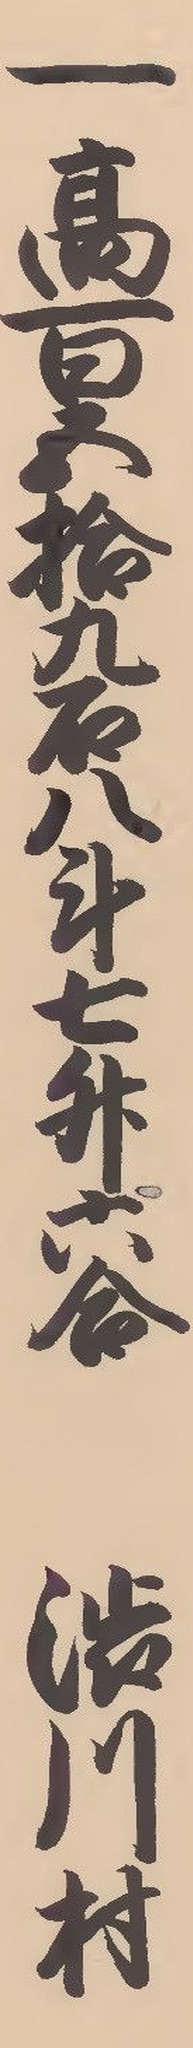一高百五拾九石八斗七升六合渋川村

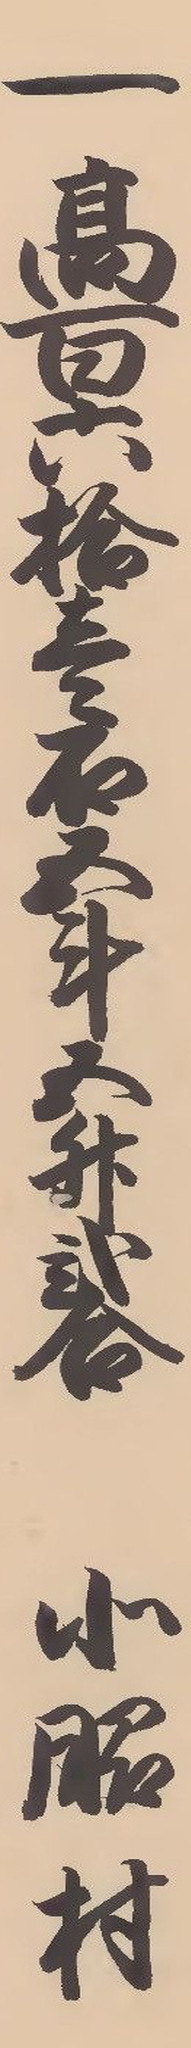一高百六拾壱石五斗五升弐合北脇村
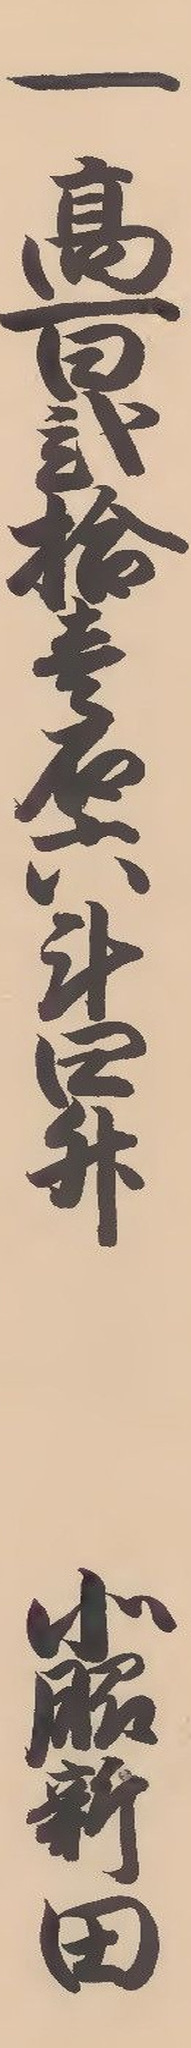一高百弐拾壱石六斗四升北脇新田
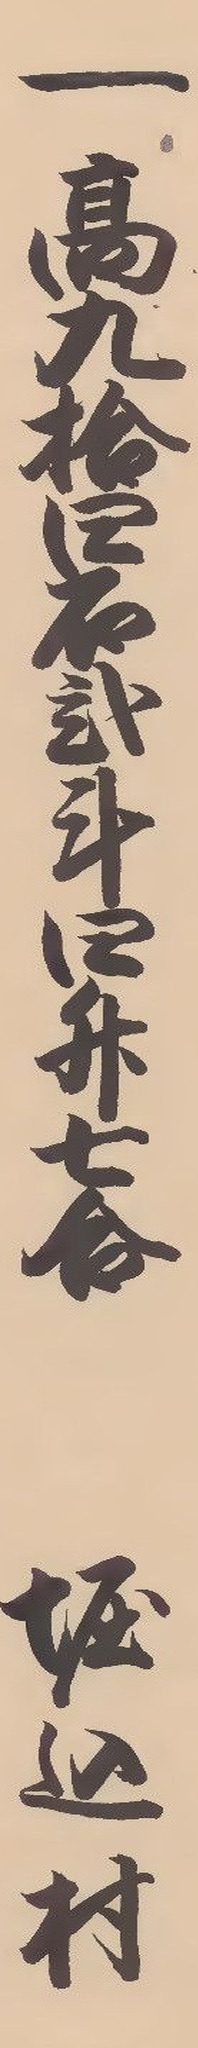一高九拾四石弐斗四升七合堀込村
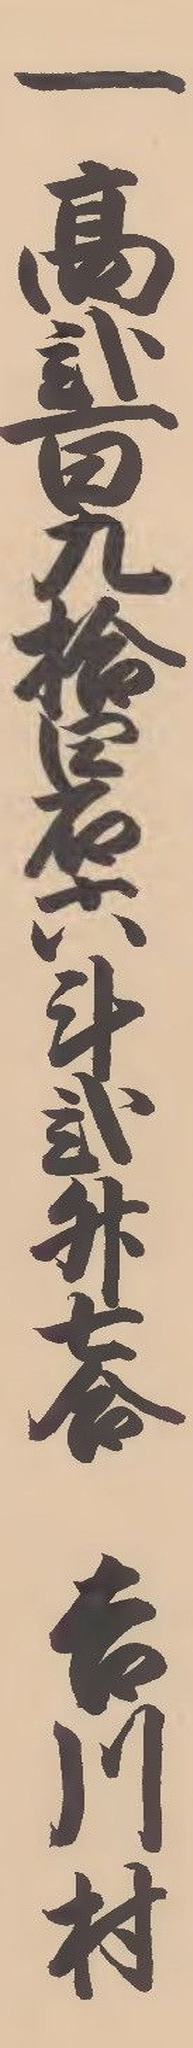一高弐百九拾四石六斗弐升七合吉川村
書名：駿河国郷帳
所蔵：国立公文書館 National Archives of Japan
